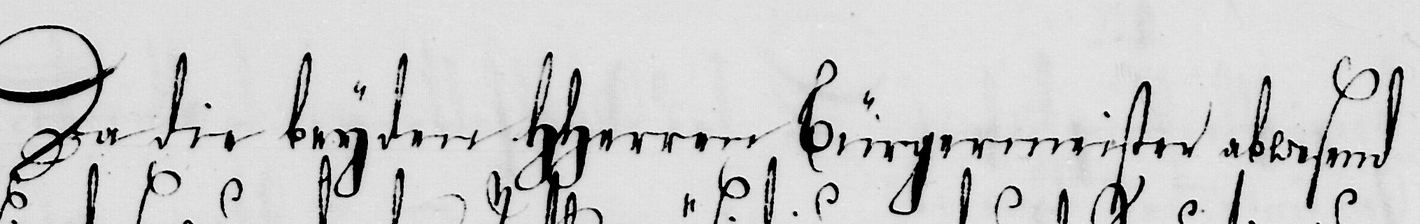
Da die beyden HHerren Bürgermeister abwesend
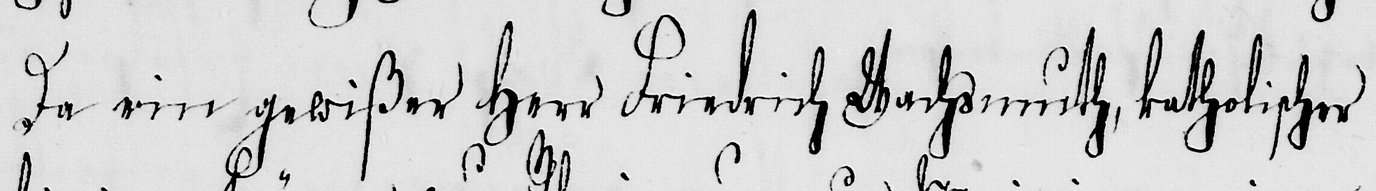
Da ein gewißer Herr Friedrich Wachsmuth, katholischer
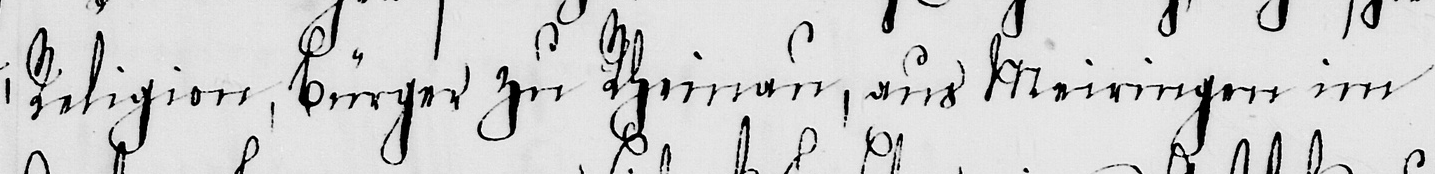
Religion, Bürger zu Rheinau, aus Meiringen im
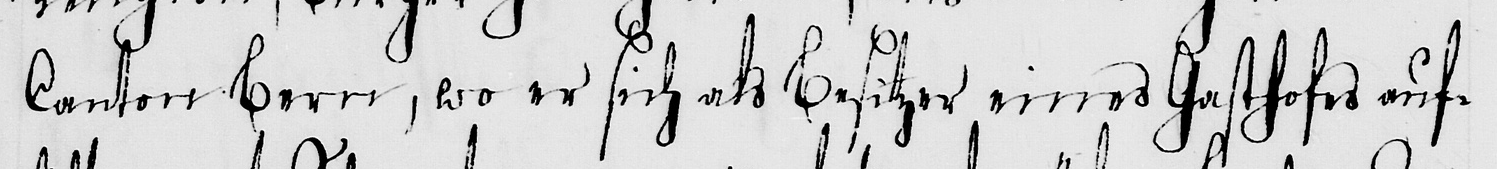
Canton Bern, wo er sich als Besitzer eines Gasthofes auf¬
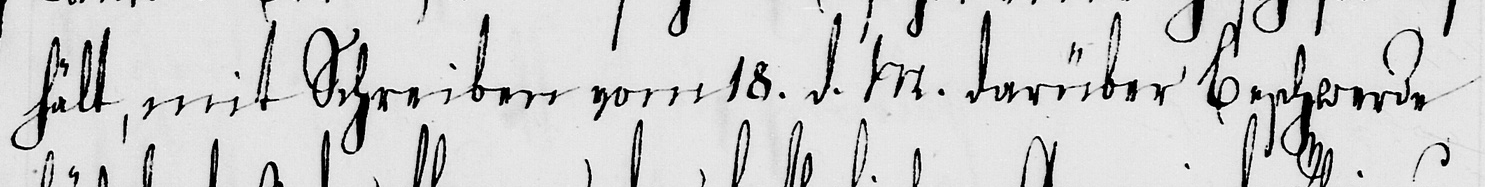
hält, mit Schreiben vom 18. d. M. darüber Beschwerde
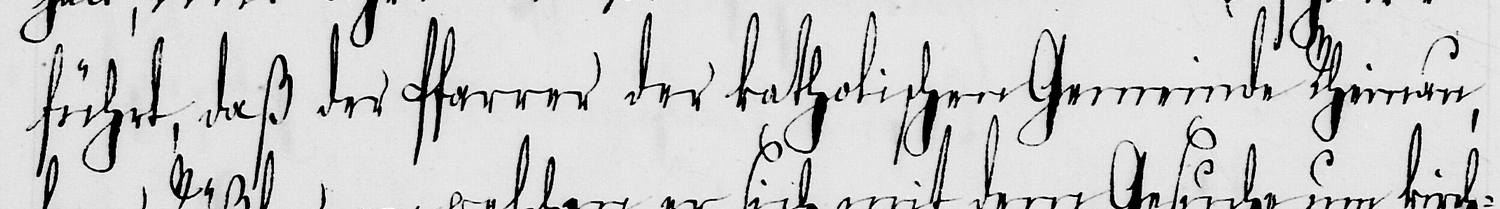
führt, daß der Pfarrer der katholischen Gemeinde Rheinau,
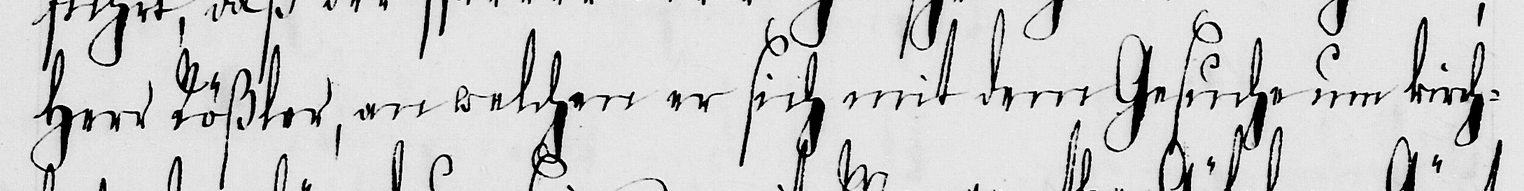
Herr Rößler, an welchen er sich mit dem Gesuche um kirch¬
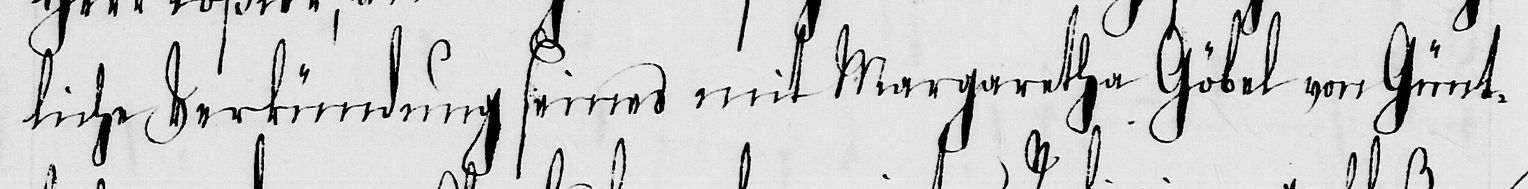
liche Verkündung seines mit Margaretha Göbel von Günt¬
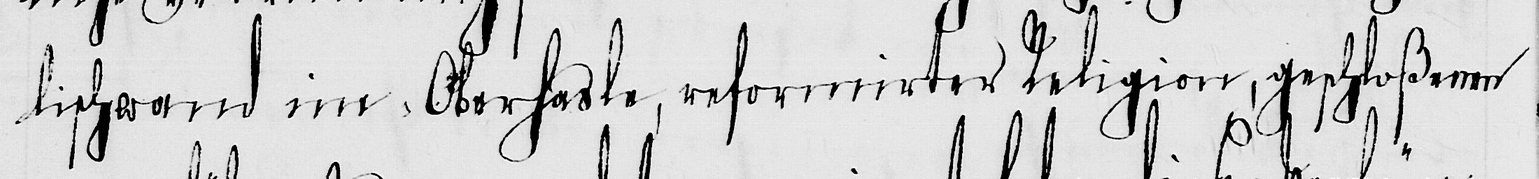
lischwand im Oberhasle, reformirter Religion, geschloßenen
